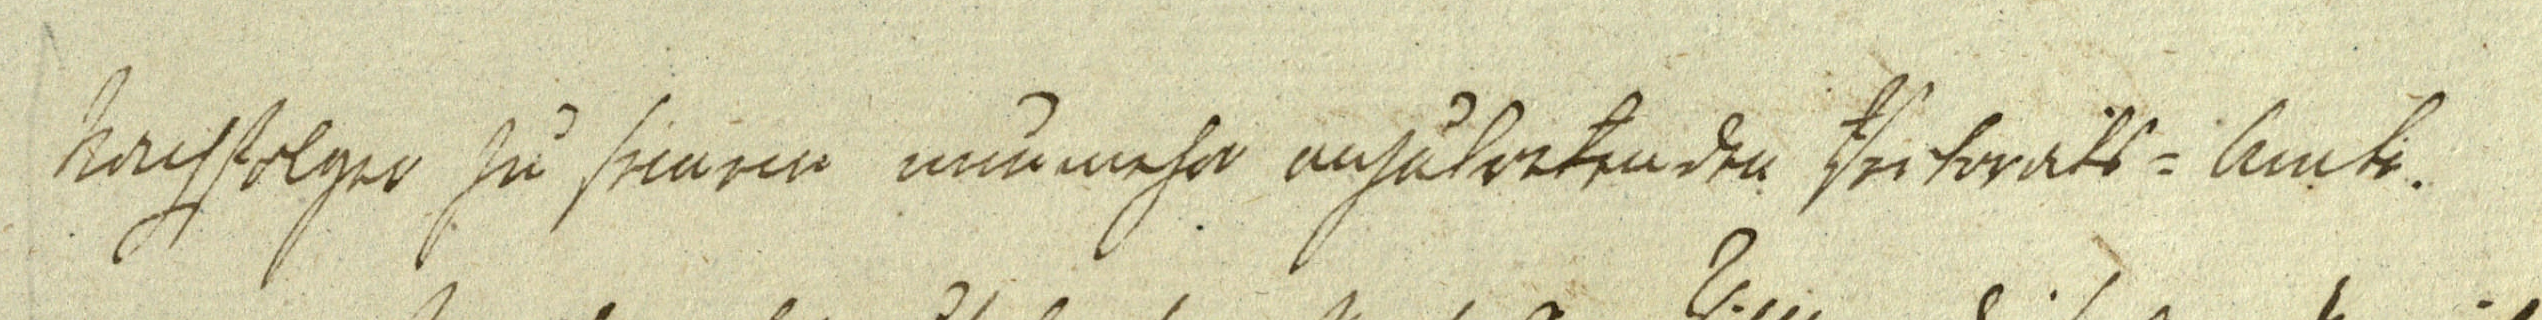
Nachfolger zu seinem nunmehro anzutretenden Rectorats-Amte.
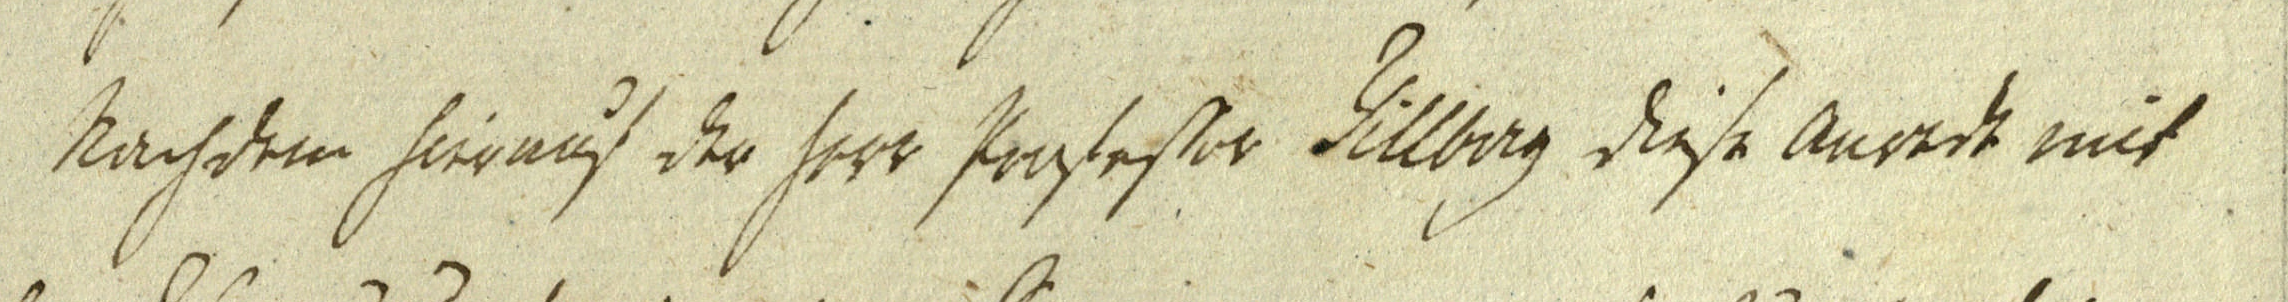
Nachdem hierauf der Herr Professor Tillberg diese Anrede mit
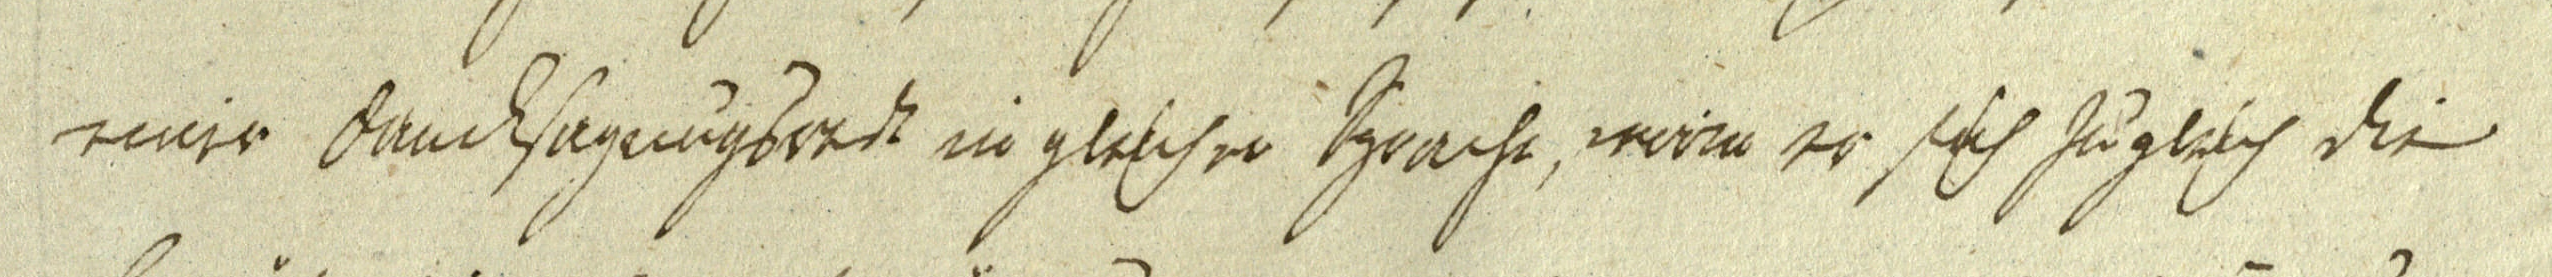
einer Dancksagungsrede in gleicher Sprache, worin er sich zugleich die
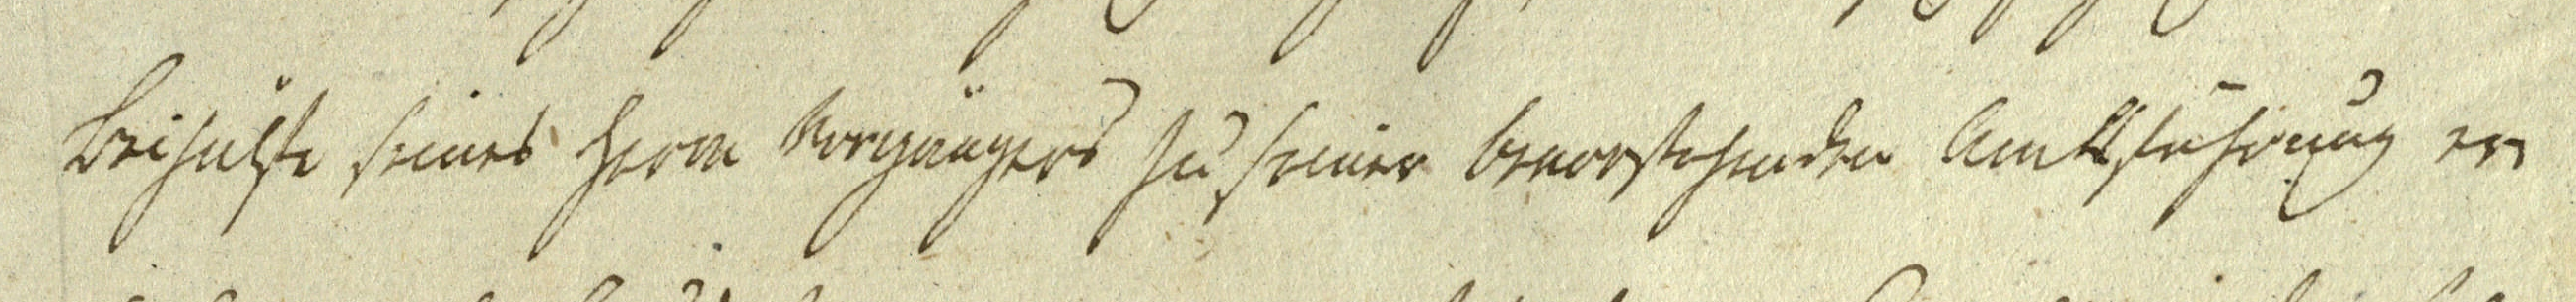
Beihülfe seines Herrn Vorgängers zu seiner bevorstehenden Amtsführung er¬
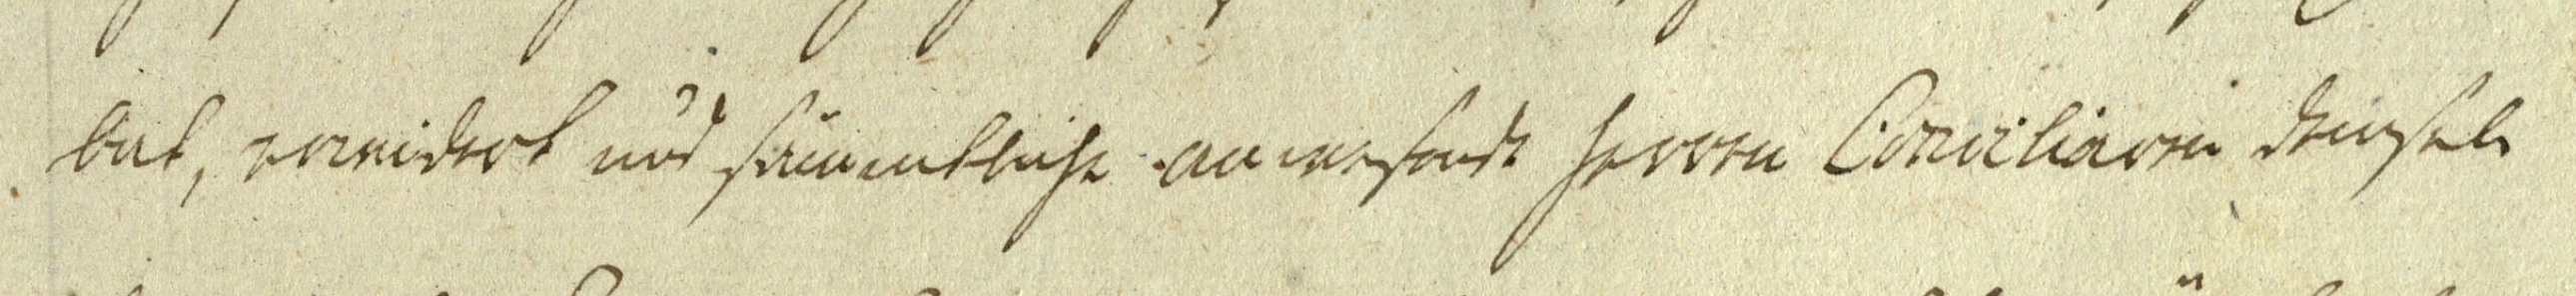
bat, erwidert und sämmtliche anwesende Herren Conciliaren demsel¬
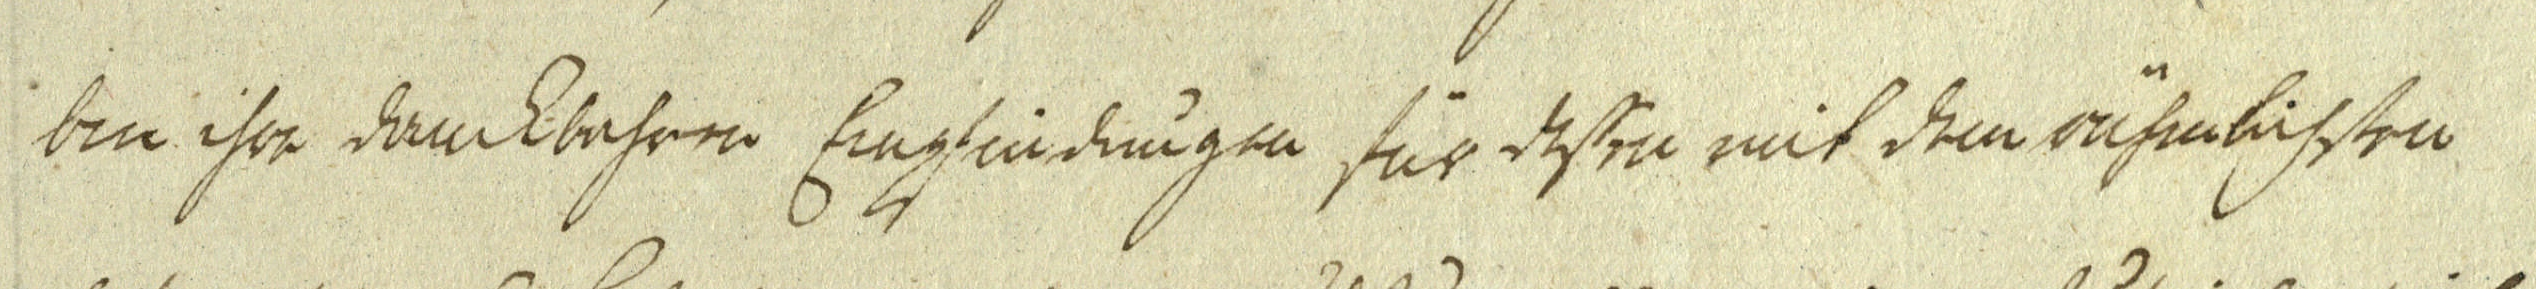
ben ihre danckbahren Empfindungen für dessen mit dem rühmlichsten
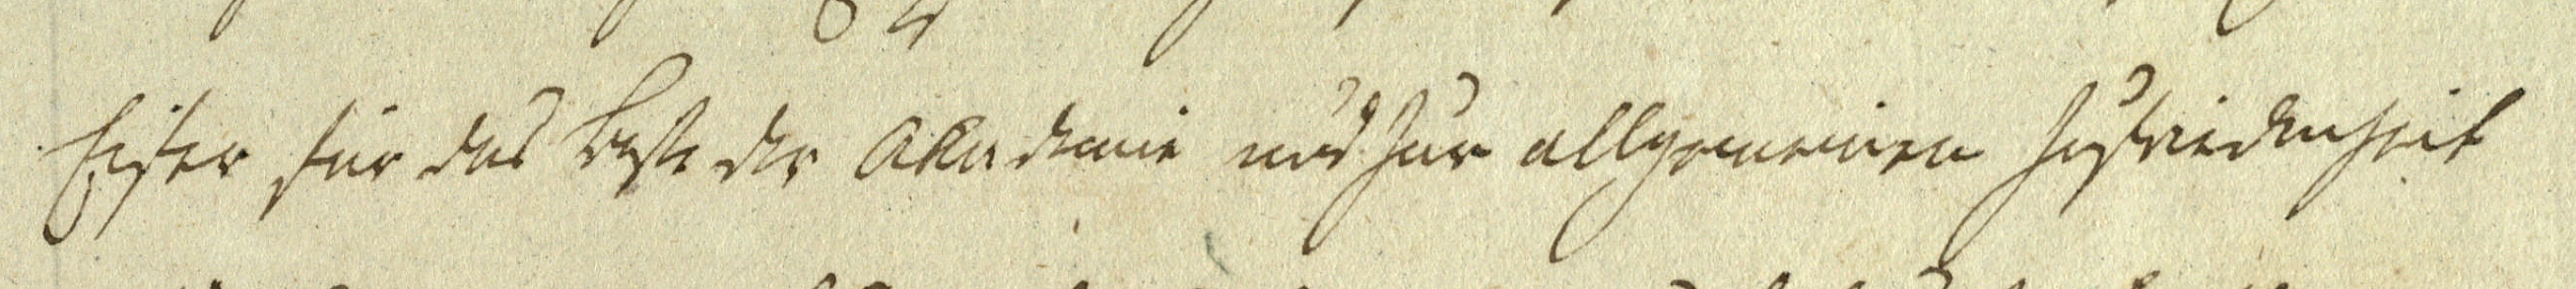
Eifer für das Beste der Akademie und zur allgemeinen Zufriedenheit
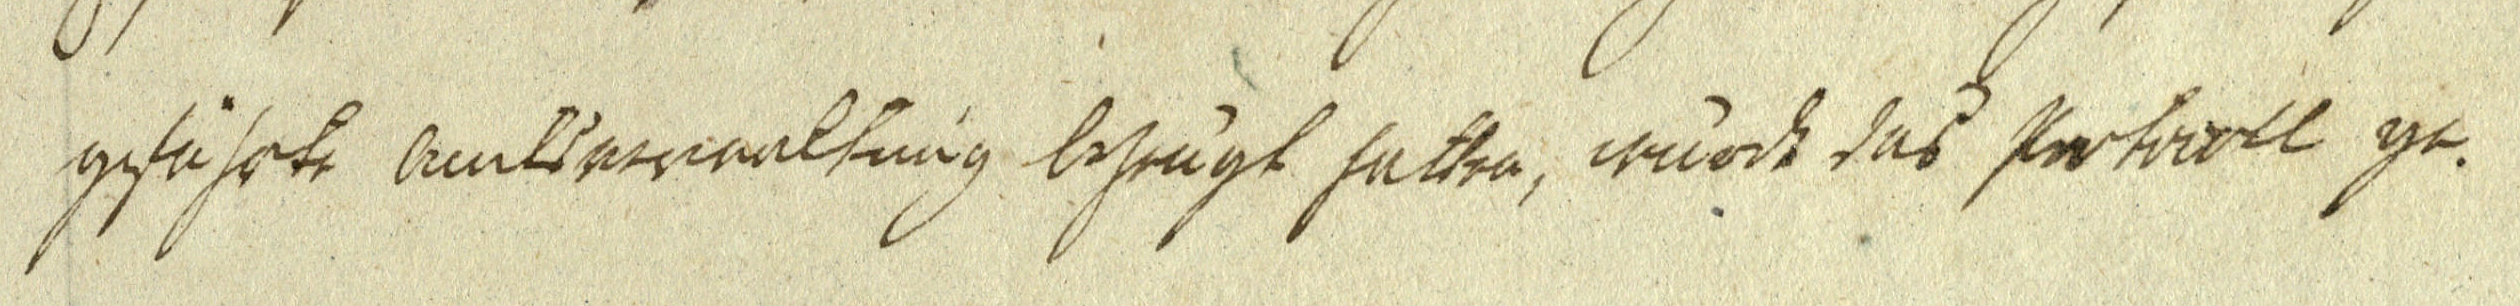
geführte Amtsverwaltung bezeugt hatten, wurde das Protocoll ge¬
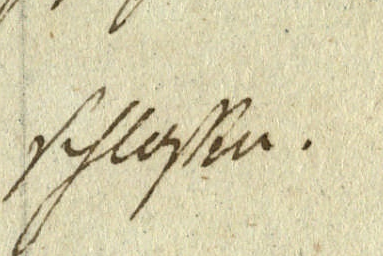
schlossen.
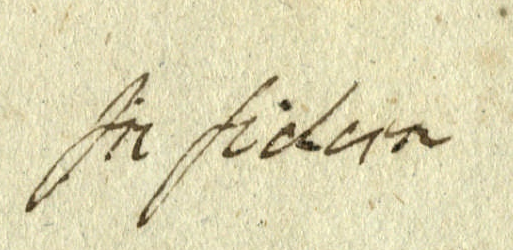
In fidem
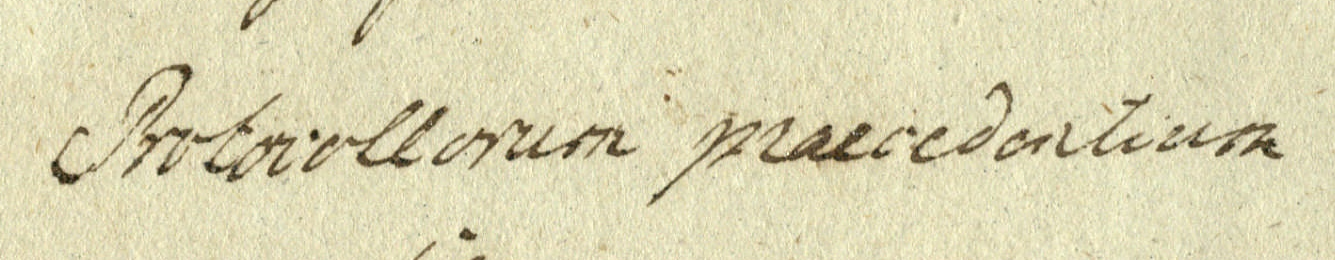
Protocollorum praecedentium
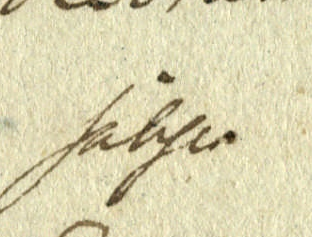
subses
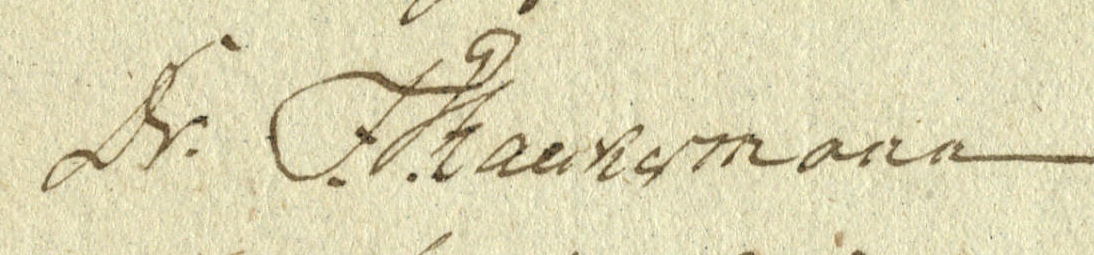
Dr. F Haeckermann
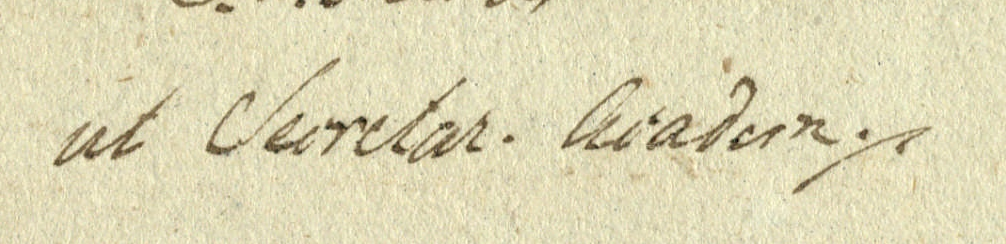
at Secretar. Academ./.
